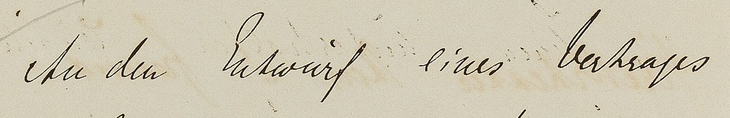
An den Entwurf eines Vertrages
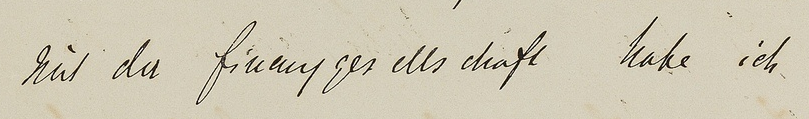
mit der Finanzgesellschaft habe ich
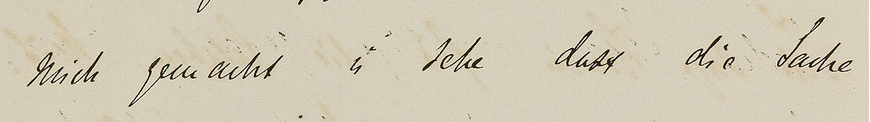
mich gemacht u sehe dass die Sache
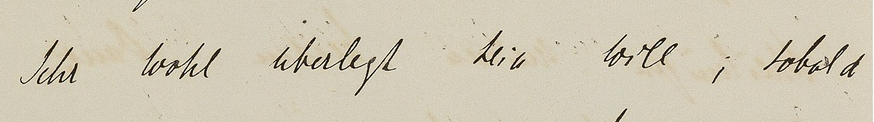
sehr wohl überlegt sein will; sobald
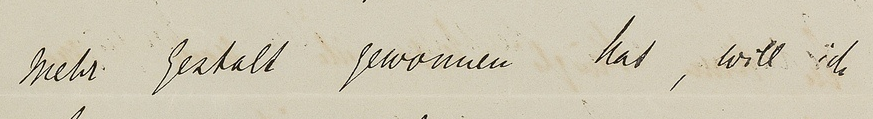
mehr Gestalt gewonnen hat, will ich
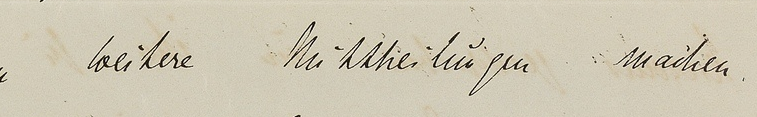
weitere Mittheilungen machen.
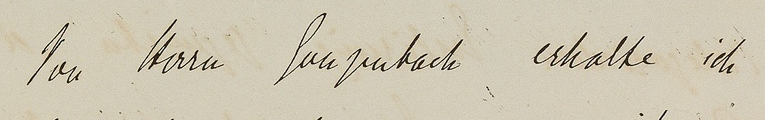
Von Herrn Gonzenbach erhalte ich
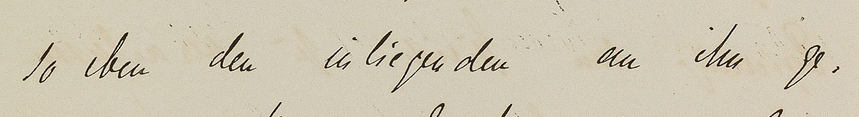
so eben den inliegenden an ihn ge-
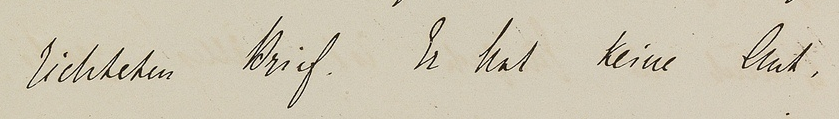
richteten Brief. Er hat keine Ant-
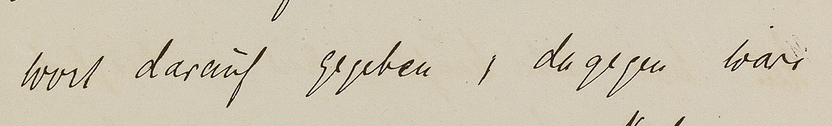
wort darauf gegeben, dagegen wäre
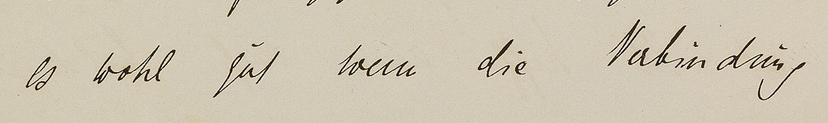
es wohl gut wenn die Verbindung
